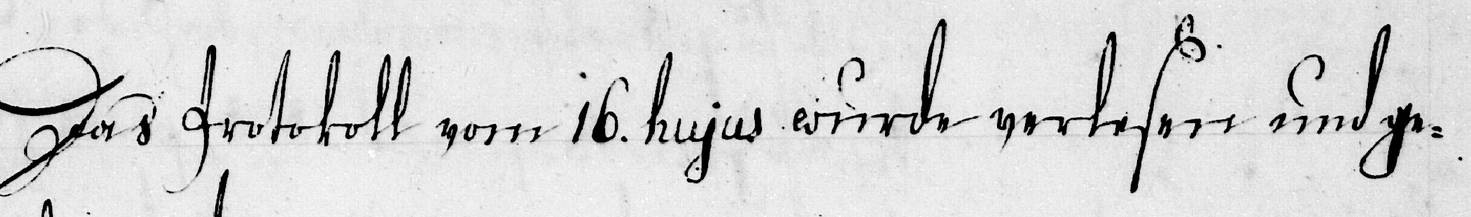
Das Protokoll vom 16. hujus wurde verlesen und ge¬
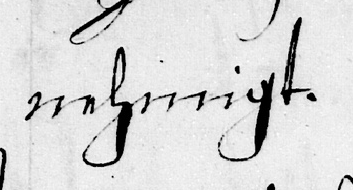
nehmigt.
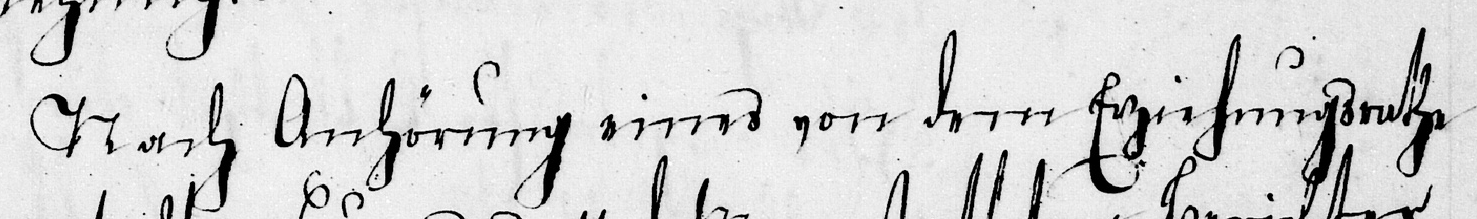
Nach Anhörung eines von dem Erziehungsrathe
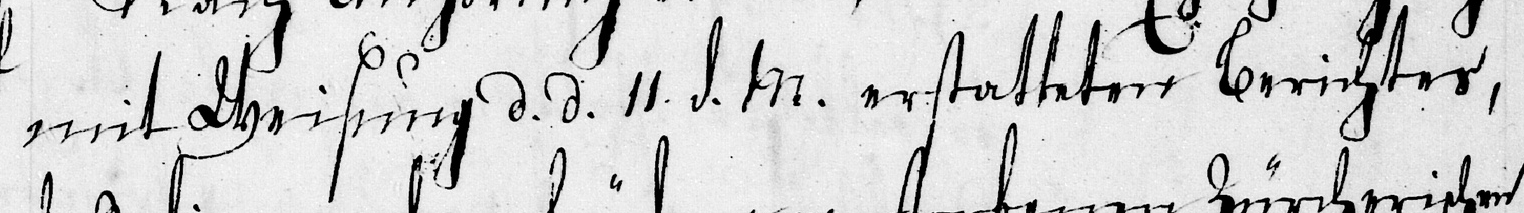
mit Weisung d. d. 11. d. M. erstatteten Berichtes,
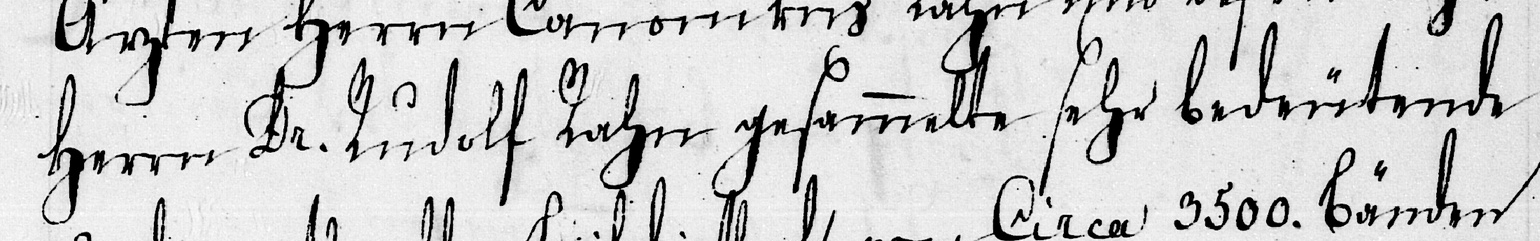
Herrn Dr. Rudolf Rahn gesammelte sehr bedeutende
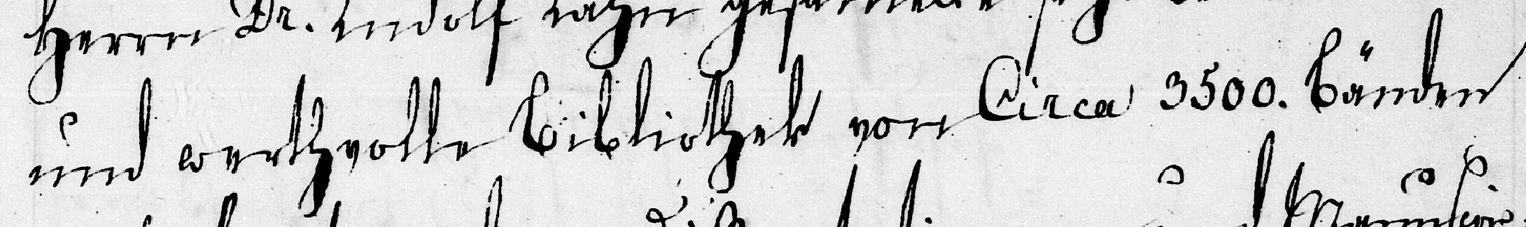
und werthvolle Bibliothek von Circa 3500. Bänden
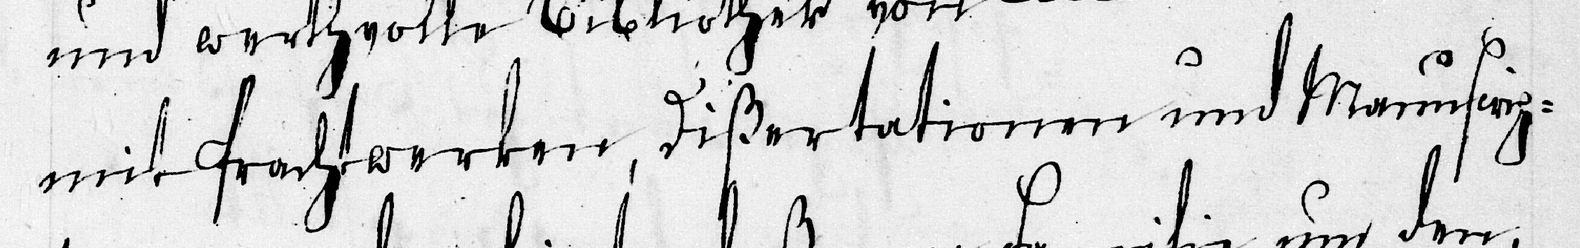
mit Prachtwerken, Dißertationen und Manuscri¬
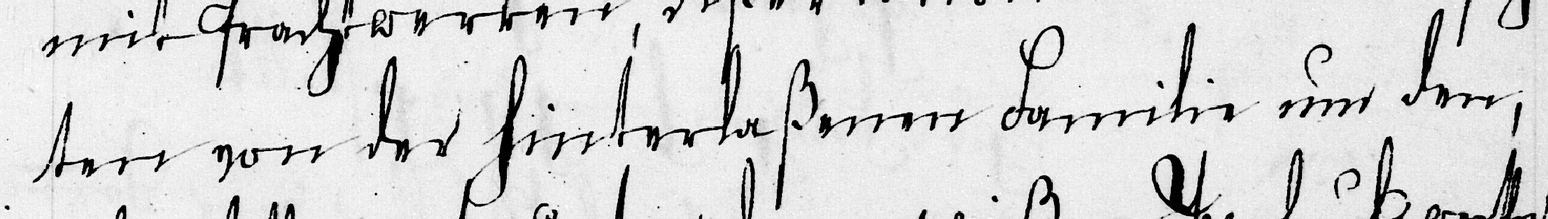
pten von der hinterlaßenen Familie nur den,
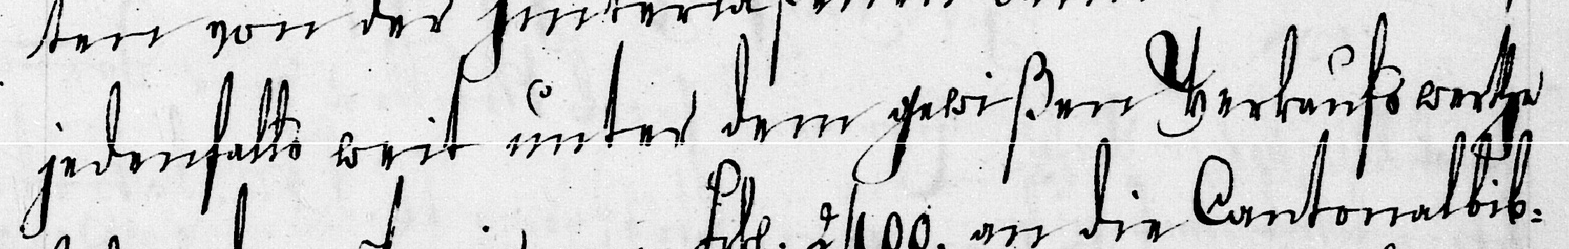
jedenfalls weit unter dem gewißen Verkaufswerthe
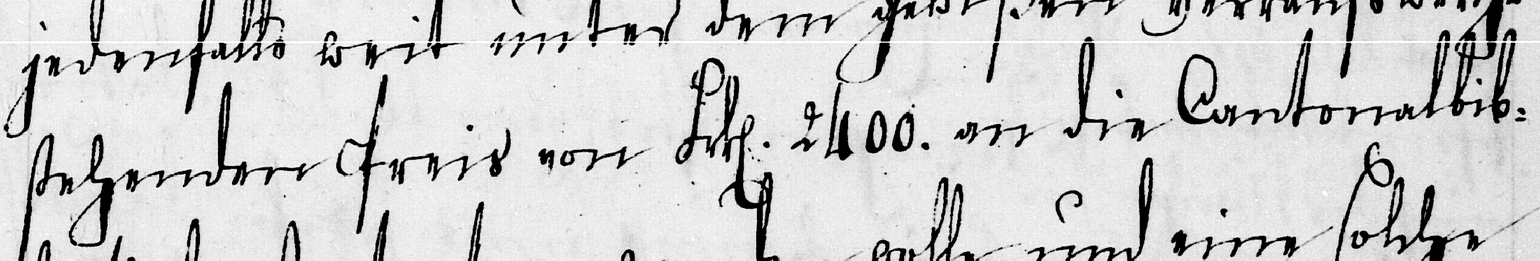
stehenden Preis von Frk[en]. 2400. an die Cantonalbib¬
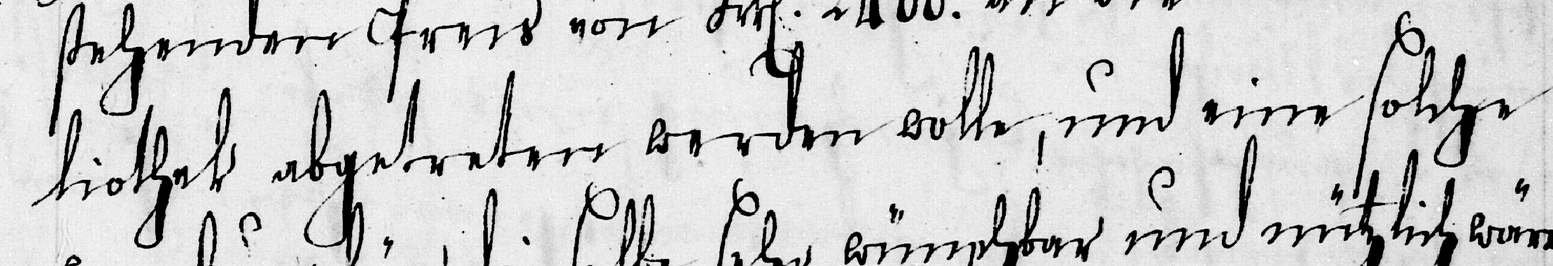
liothek abgetreten werden wolle, und eine solche
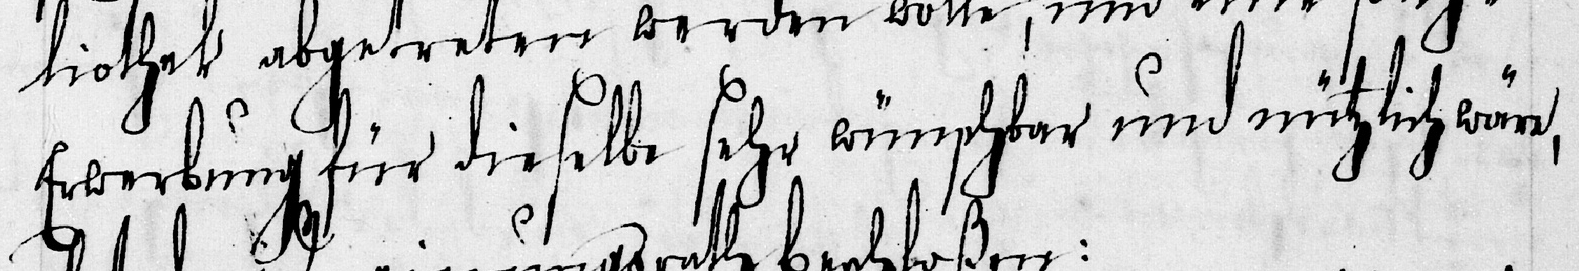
Erwerbung für dieselbe sehr wünschbar und nützlich wär¬
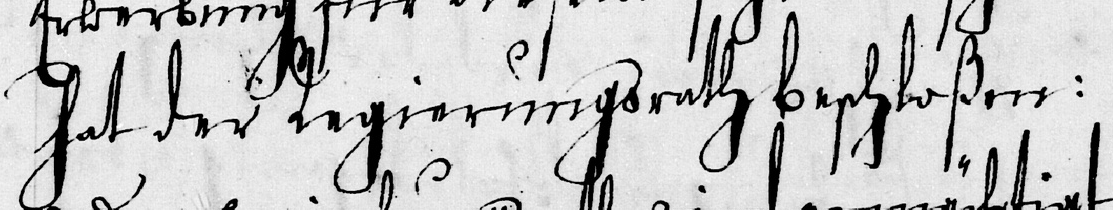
hat der Regierungsrath beschloßen:
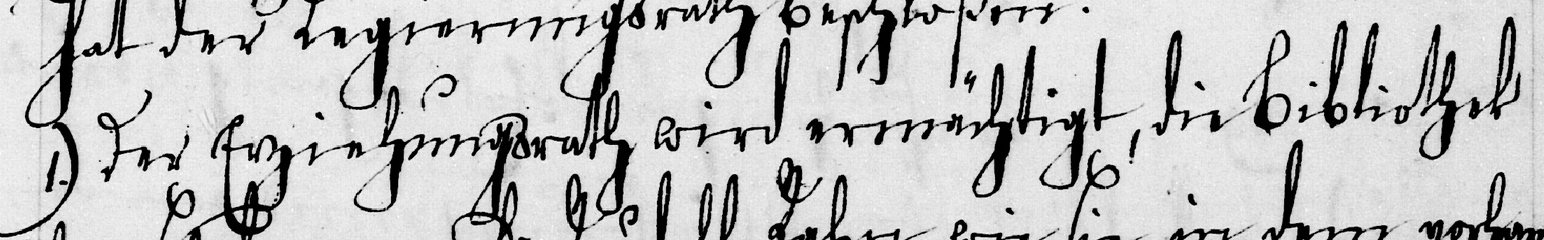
1.) Der Erziehungsrath wird ermächtigt, die Bibliothek
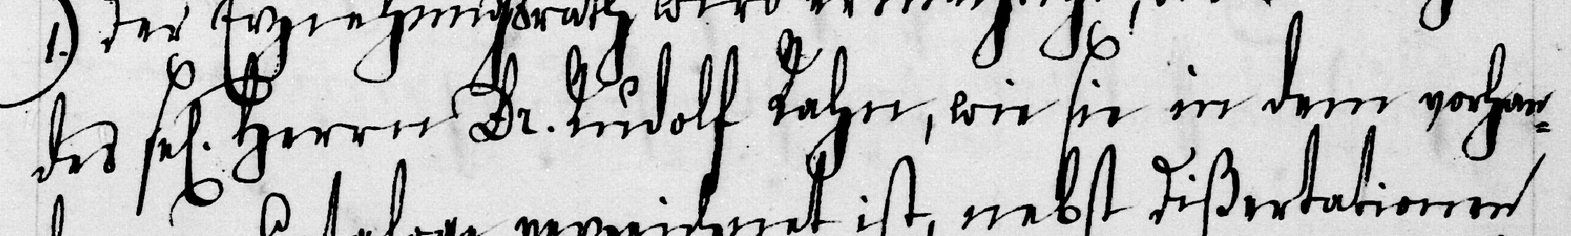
des sel. Herrn Dr. Rudolf Rahn, wie sie in dem vorhan¬
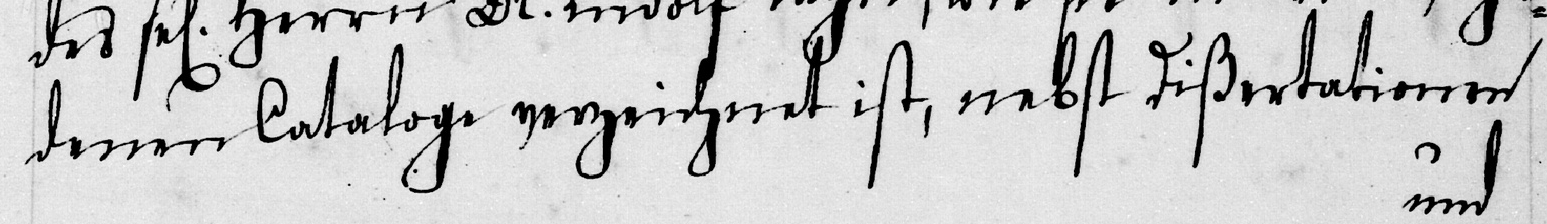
denen Cataloge verzeichnet ist, nebst Dißertationen
